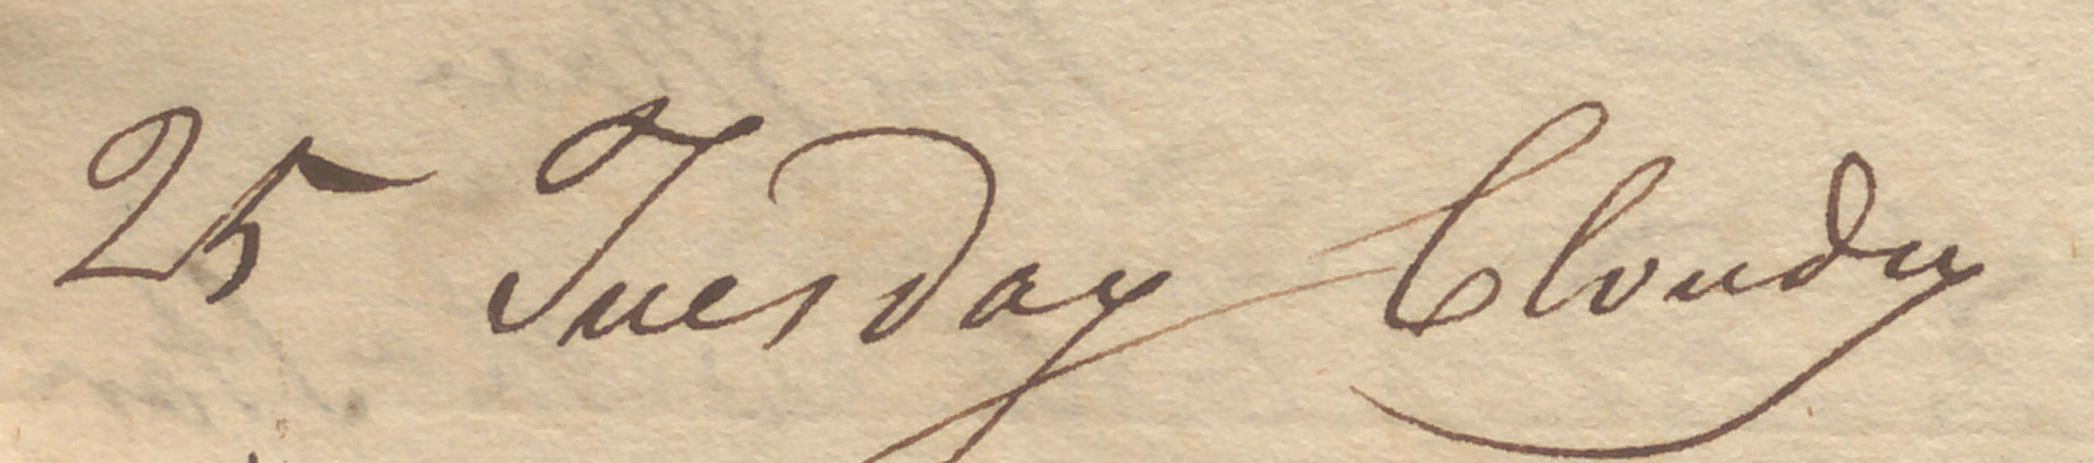25 Tuesday Cloudy
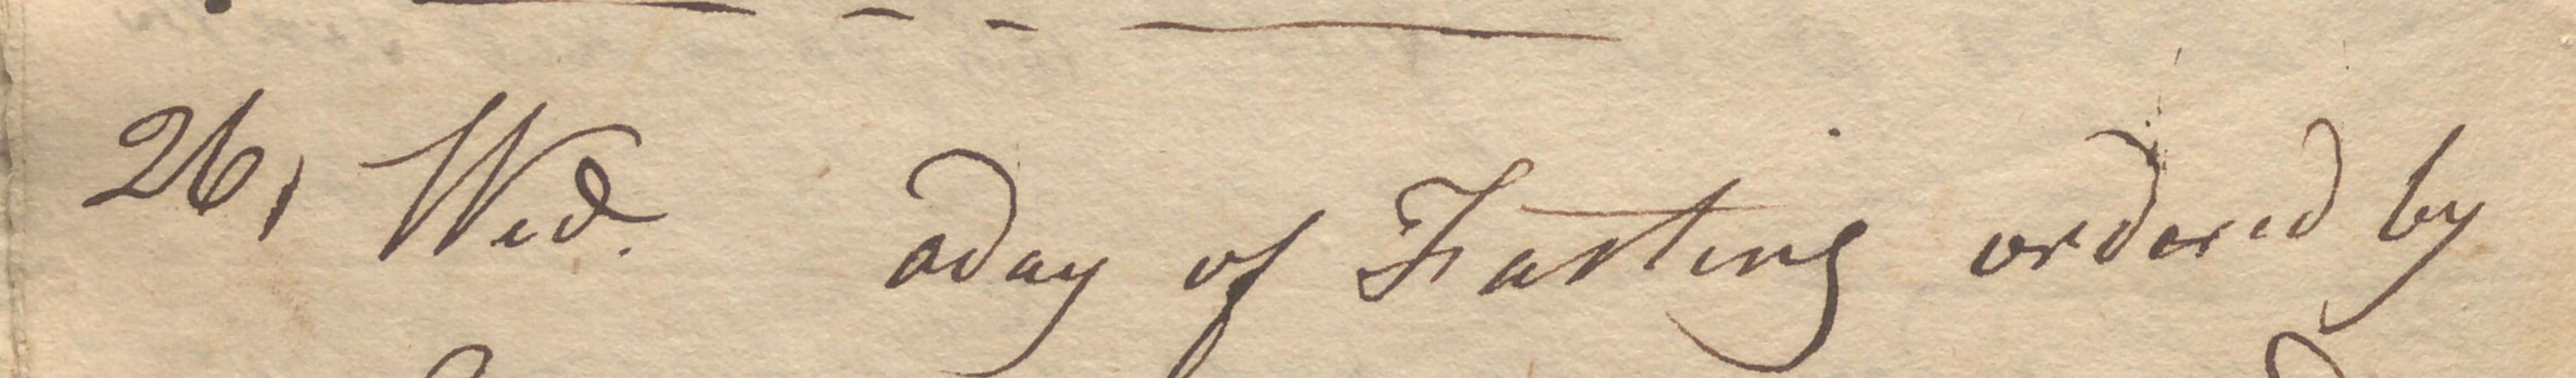26 Wed. a day of Fasting ordered by
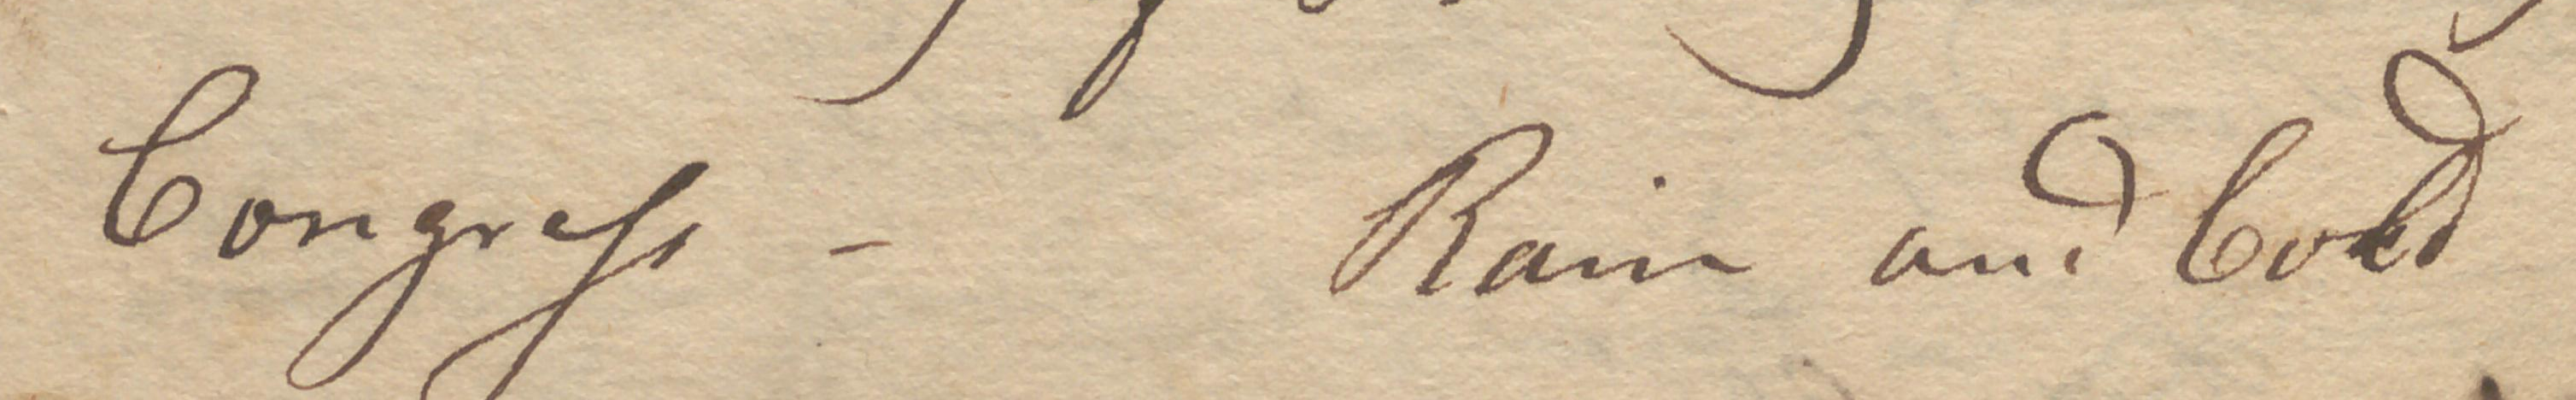Congress- Rain and Cold
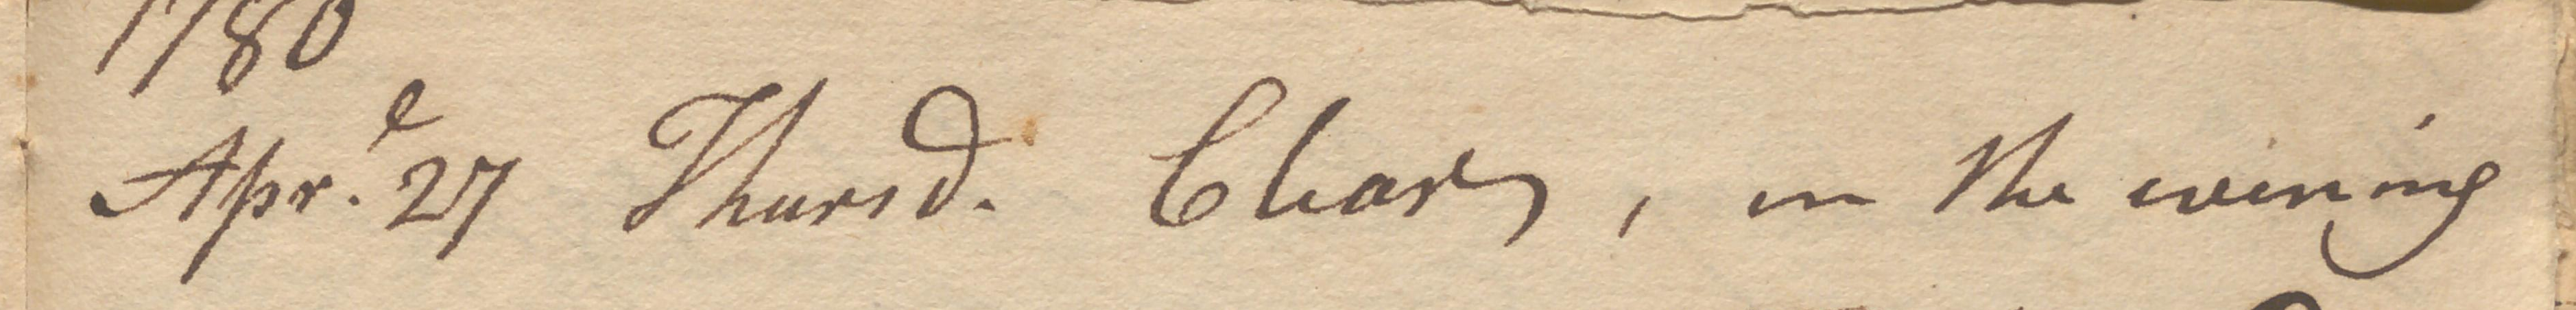Apr^l. 27 Thursd. Clear, in the evening
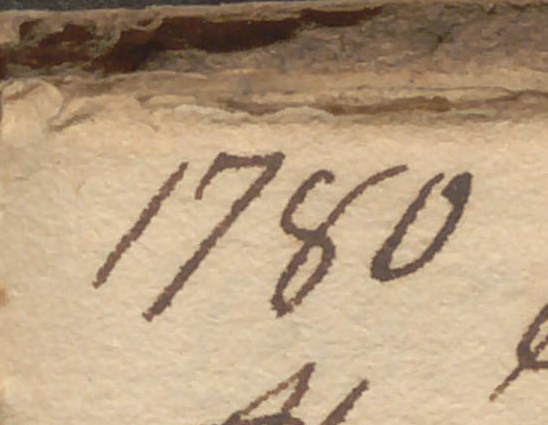1780
